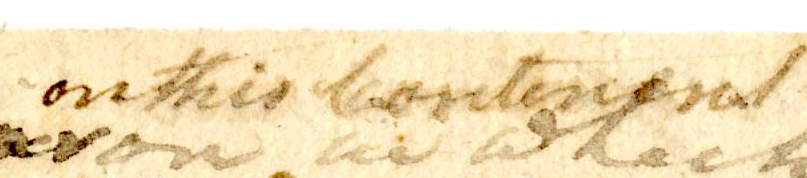on this Continent
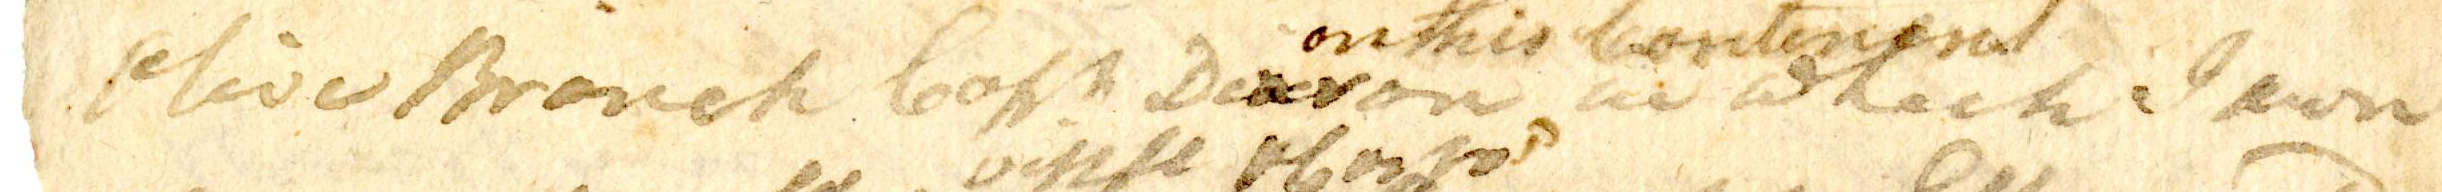Olive Branch Cap^t. Dearon ^ we which I own
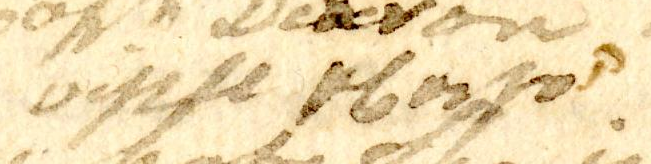vessel &C as p
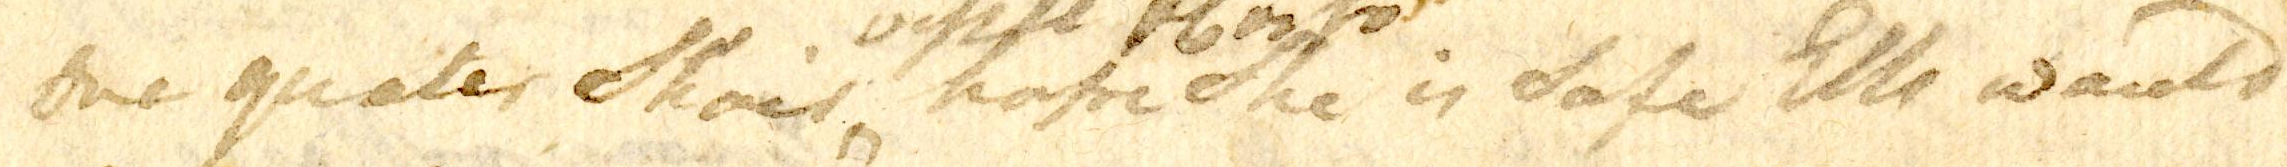one quater Shair, ^ hope She is safe Ells would
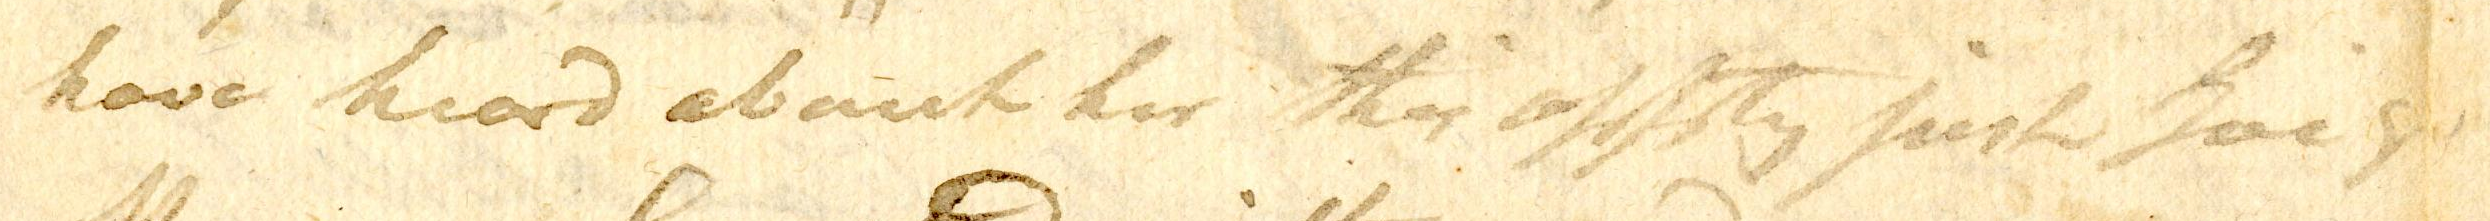have heard about her this opp^ty just Going
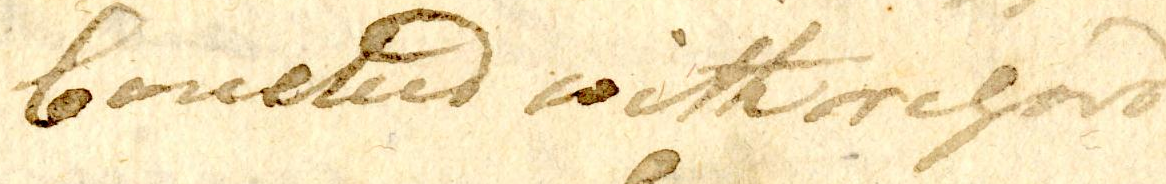Canceled with regard
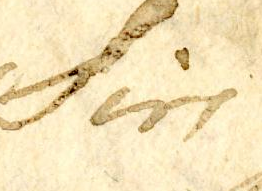Sirs
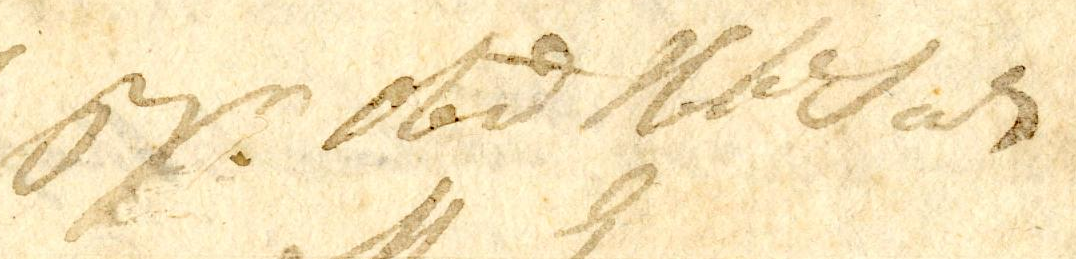Y^r able Hl Ser^t
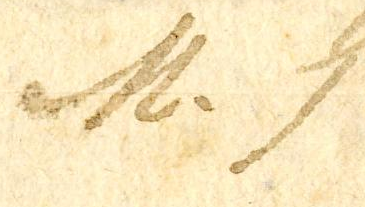M. I
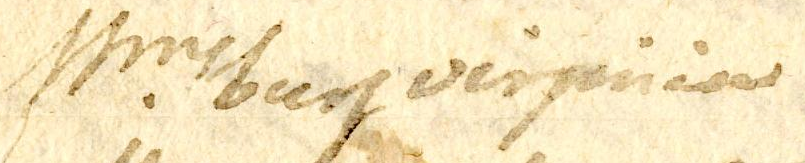W^msburg VIrginia
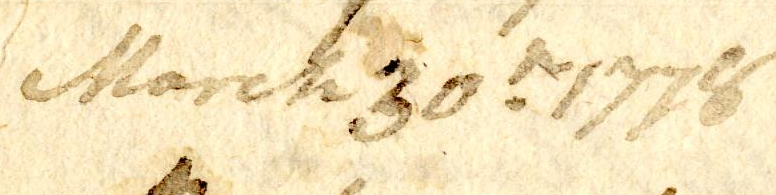March 30^th 1778
